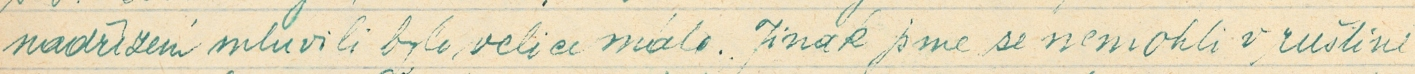nadřízení mluvili bylo velice málo. Jinak jsme se nemohli v ruštině
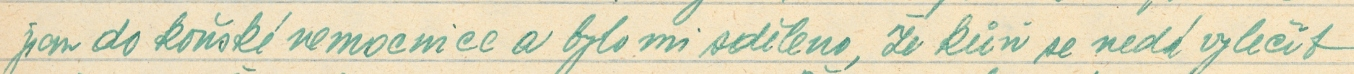jsem do koňské nemocnice a bylo mi sděleno, že kůň se nedá vylečit
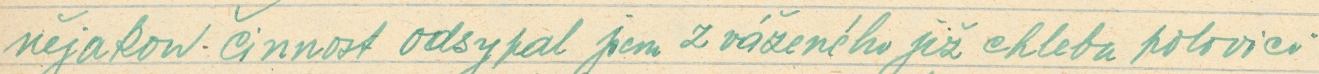nějakou činnost odsypal jsem z váženého již chleba polovici
